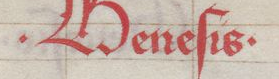.Geneſis.
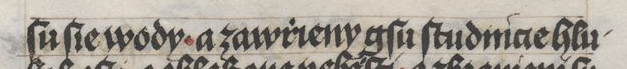ſu ſie wody.a zawṙieny gſu ſtudnicie hlu¬
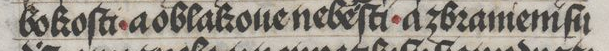bokoſti.a oblakoue nebeẛtí.a zbranieni ſu
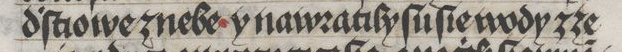dſtiowe znebe.y nawratily ſu ſie wody z ze¬
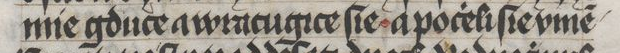mie gduce a wratugice ſie.a poċeli ſie vmē
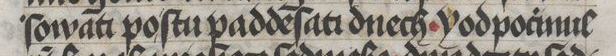ẛowati poſtu paddeſati dnech.Yodpoċinul
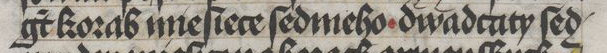ḡt korzab mieſiece ſedieho.dwadcaty ſed¬
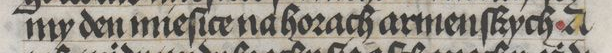my den míeſice na horach armenſkych.A
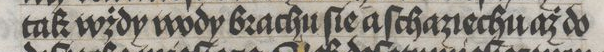tak wżdy wody brachu ſie a ſchaziechu aż do
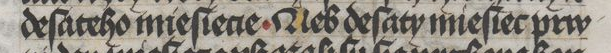deſateho mieſiecie.Neb deſaty mieſiec prw¬
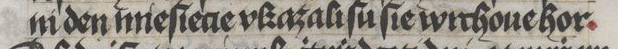ni den mieſiecie vkazali ſu ſie wrchoue hor.
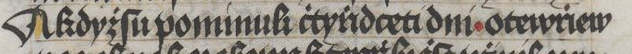A kdyżſu pomimuli ċtyṙidceti dní.otewṙiew
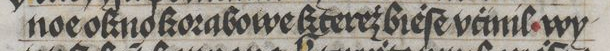noe okno korabowe ktereż bieẛe vċinil.wy¬
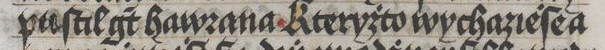puſtil ḡt hawrana.Kteryżto wychazieẛe a
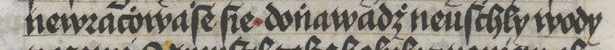newracowaẛe ſie.doṅawadż neuſchly wody
